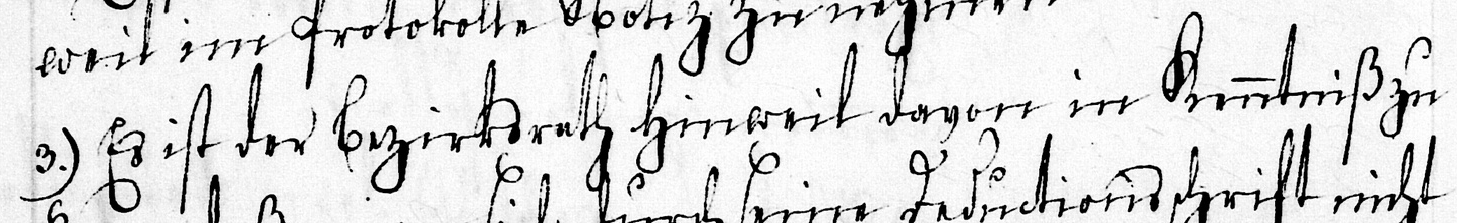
3.) Es ist der Bezirksrath Hinweil davon in Kenntniß zu
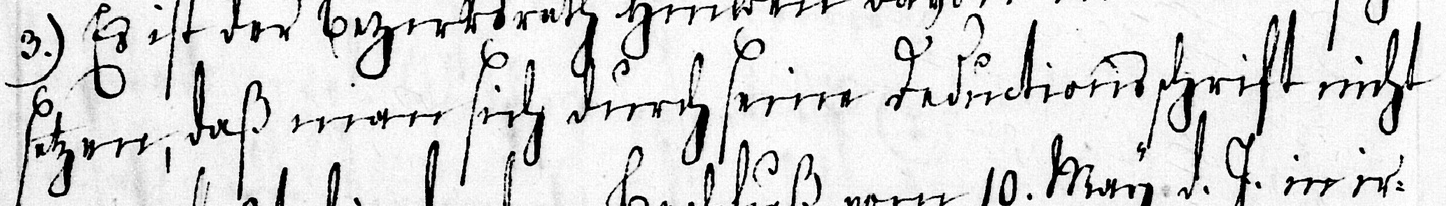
setzen, daß man sich durch seine Deductionsschrift nicht
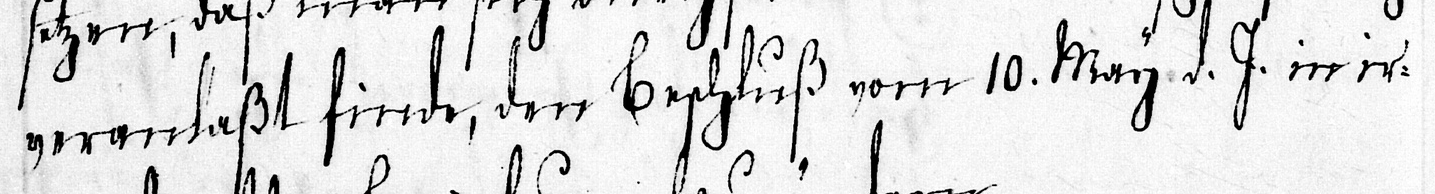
veranlaßt finde, den Beschluß vom 10. May d. J. in ir¬
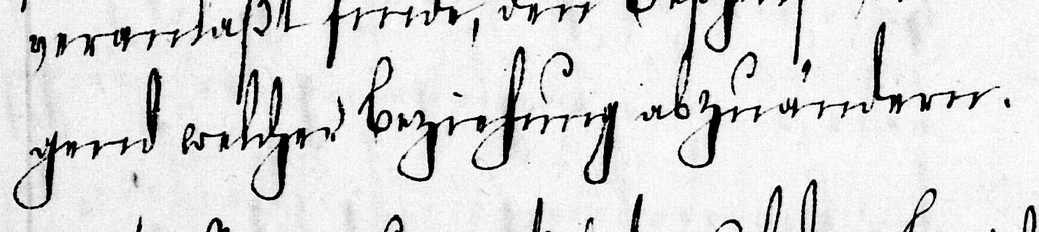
gend welcher Beziehung abzuändern.
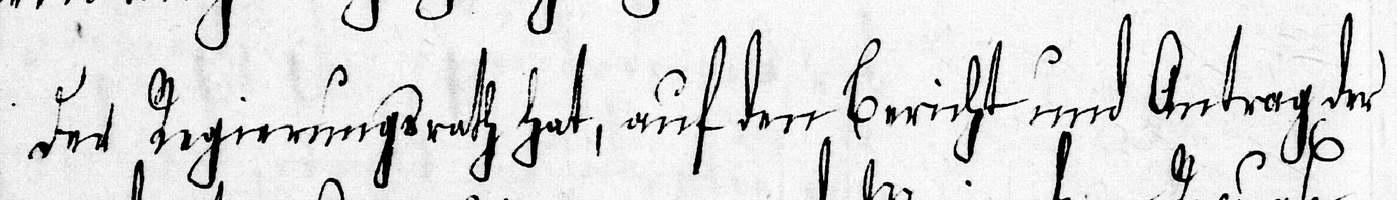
Der Regierungsrath hat, auf den Bericht und Antrag der
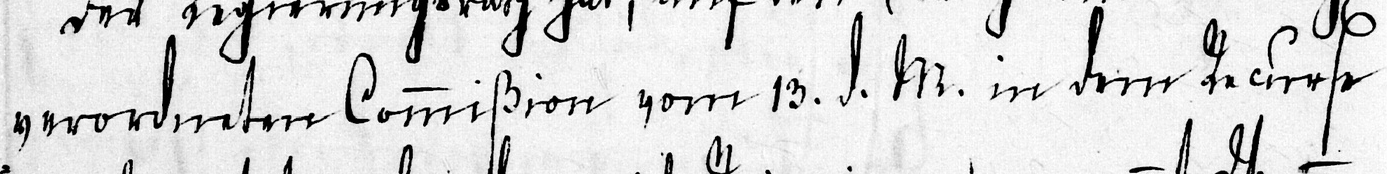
verordneten Commißion vom 13. d. M. in dem Recurse
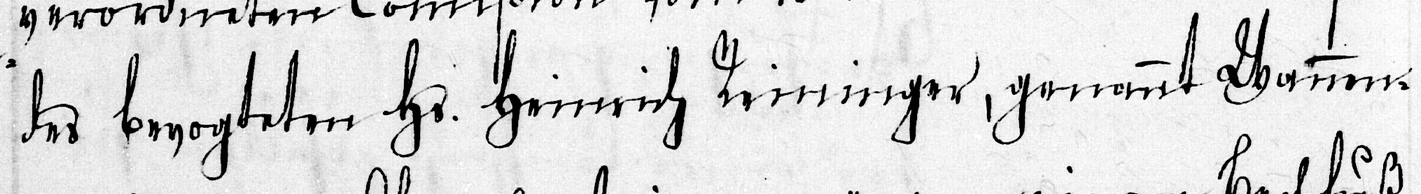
des bevogteten Hs. Heinrich Reininger, genannt Wannen¬
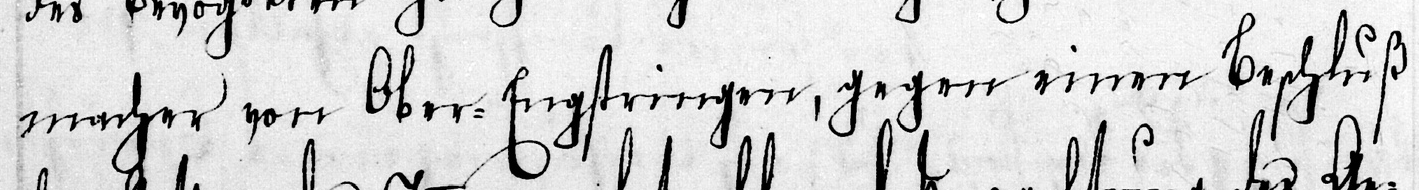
macher von Ober-Engstringen, gegen einen Beschluß
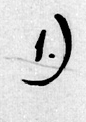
2.)
